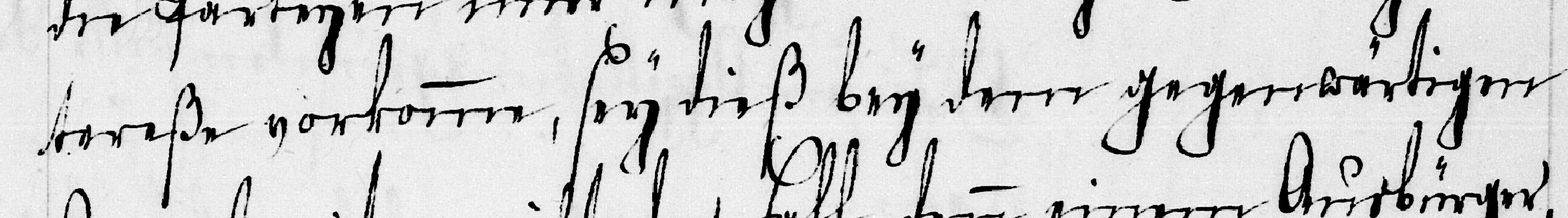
tereße vorkomme, sey dieß bey dem gegenwärtigen
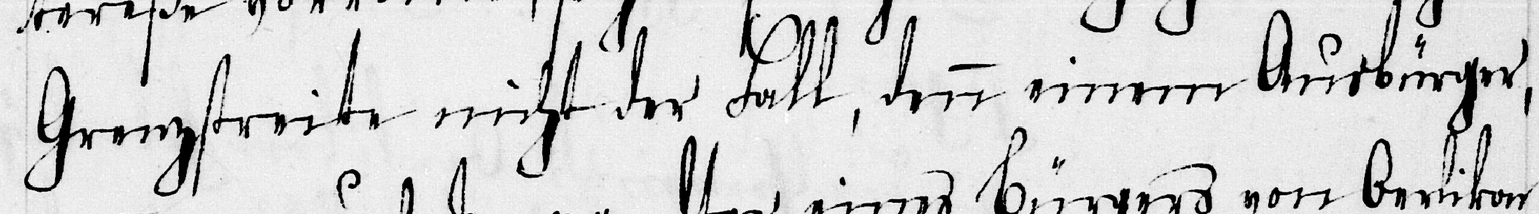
Grenzstreite nicht der Fall, denn einem Ausbürger,
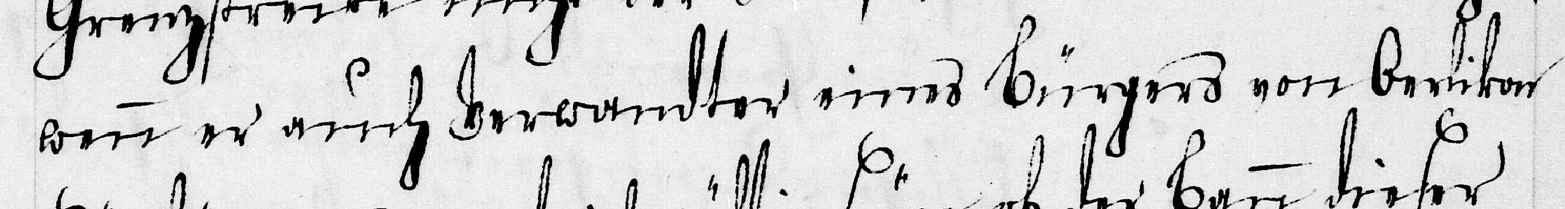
wenn er auch Verwandter eines Bürgers von Oerlikon
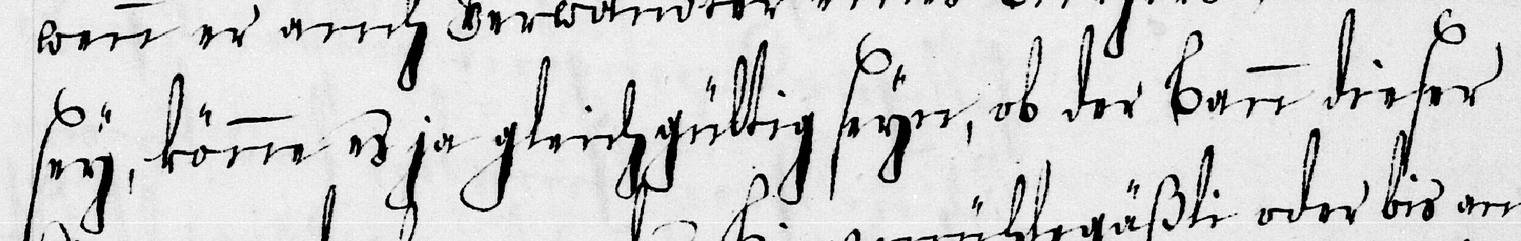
sey, könne es ja gleichgültig seyn, ob der Bann dieser
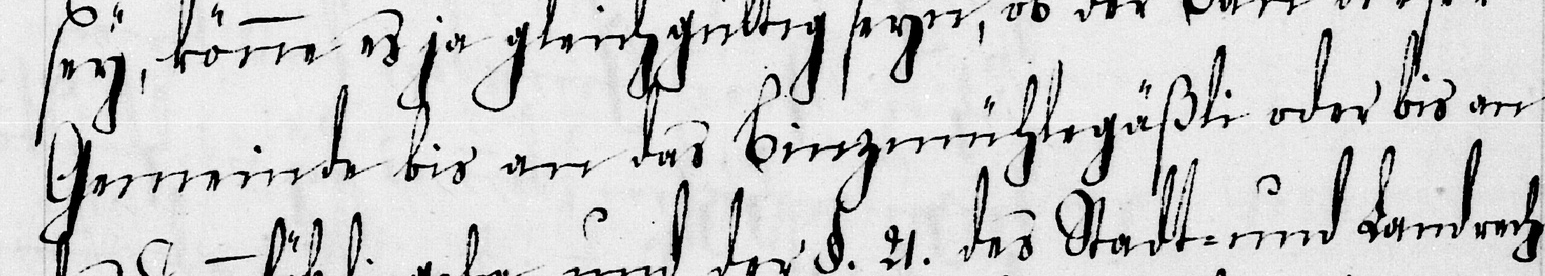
Gemeinde bis an das Binzmühlegäßli oder bis an
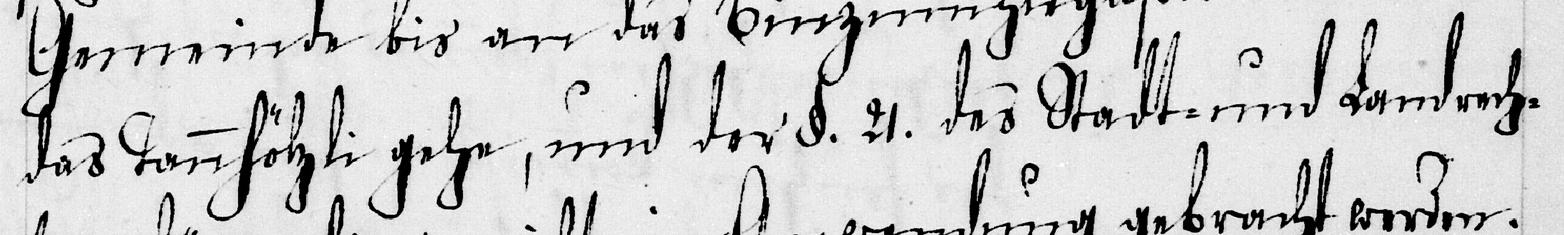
das Tannhölzli gehe, und der §. 21. des Stadt- und Landrech¬
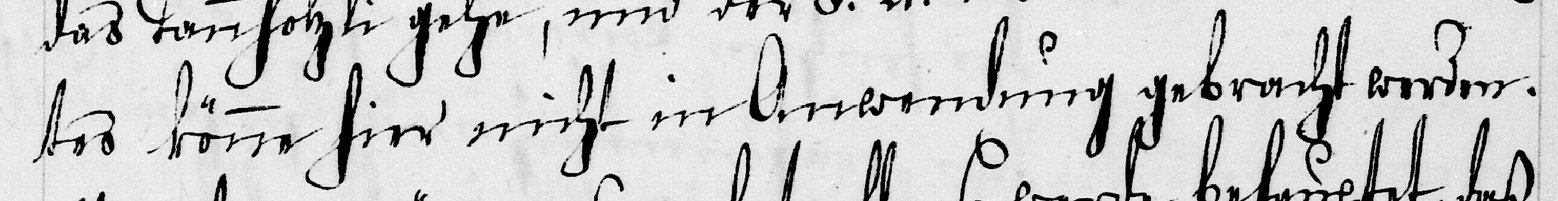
tes könne hier nicht in Anwendung gebracht werden.
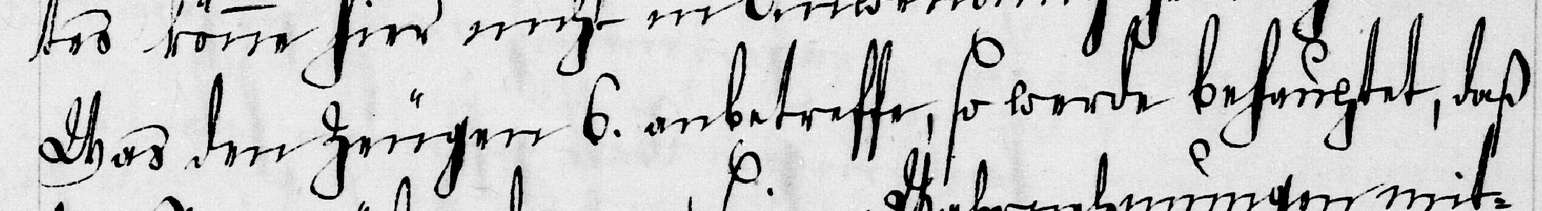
Was den Zeugen 6. anbetreffe, so werde behauptet, daß
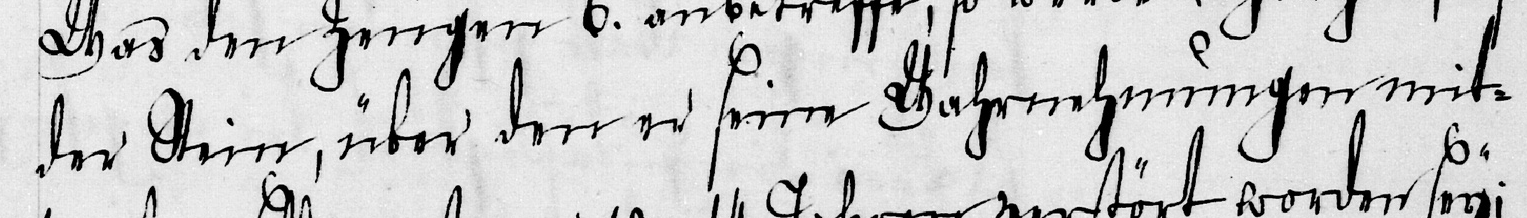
der Stein, über den er seine Wahrnehmungen mit¬
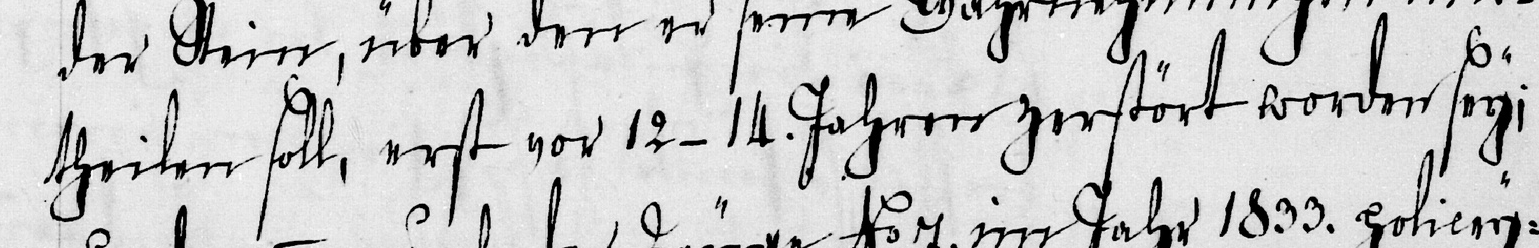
theilen soll, erst vor 12–14. Jahren zerstört worden sey;
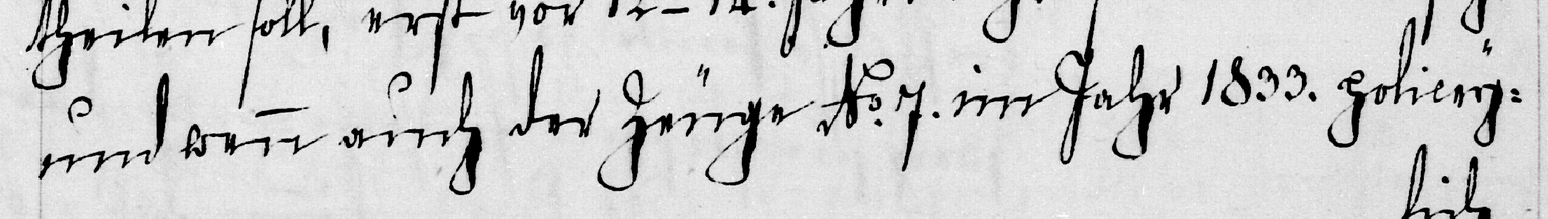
und wenn auch der Zeuge No. 7. im Jahr 1833. policey-
